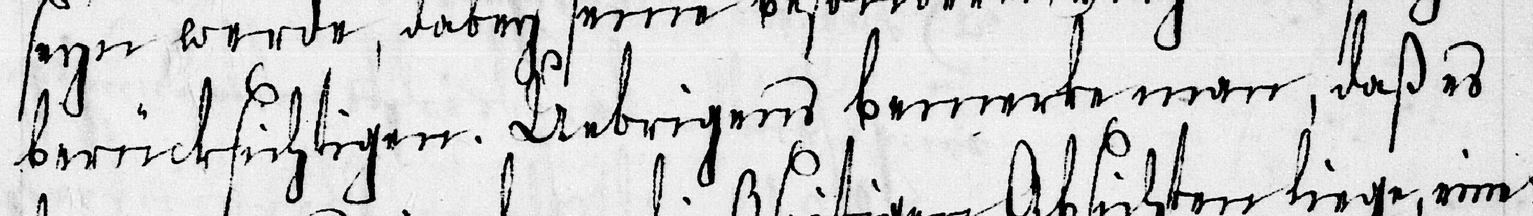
berücksichtigen. Uebrigens bemerke man, daß es
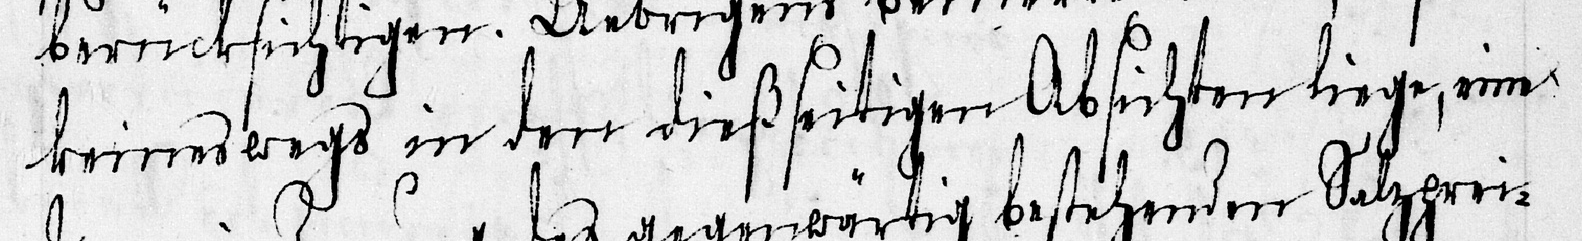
keineswegs in den dießseitigen Absichten liege, eine
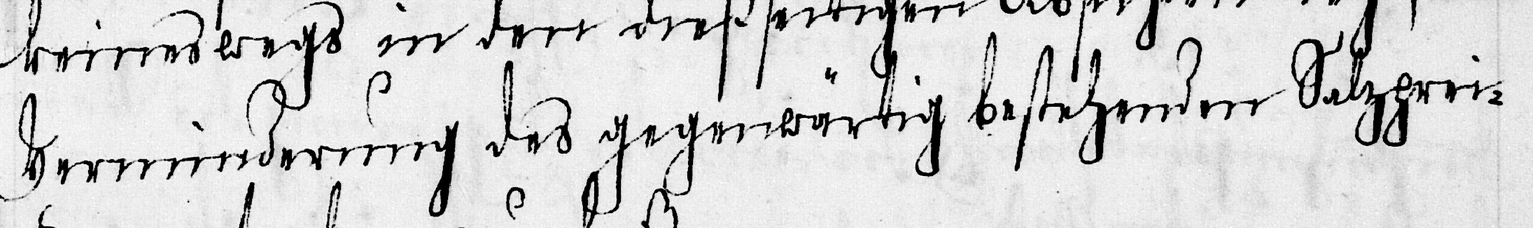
Verminderung des gegenwärtig bestehenden Salzprei¬
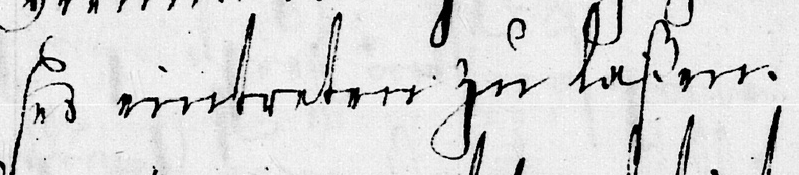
ses eintreten zu laßen.
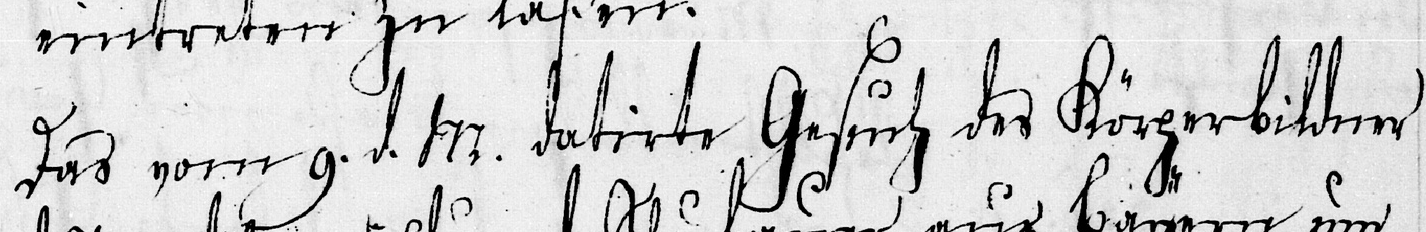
Das vom 9. d. M. datirte Gesuch des Körperbildner
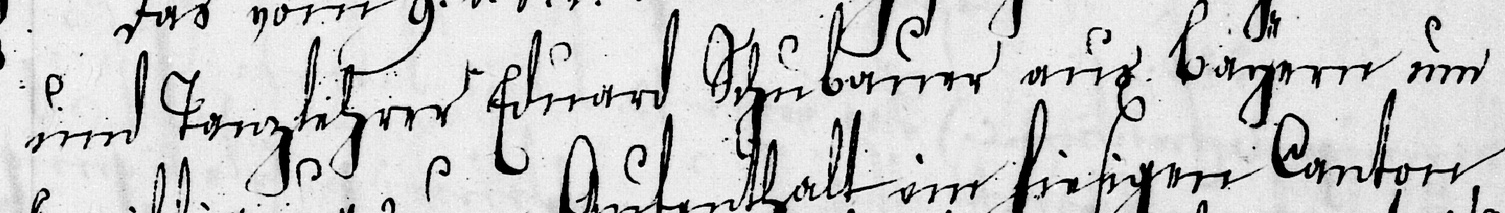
und Tanzlehrer Eduard Schubauer aus Bayern um
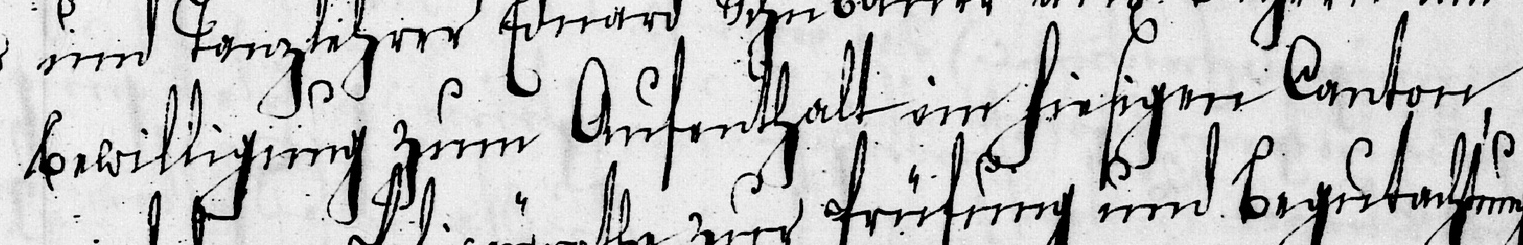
Bewilligung zum Aufenthalt im hiesigen Canton
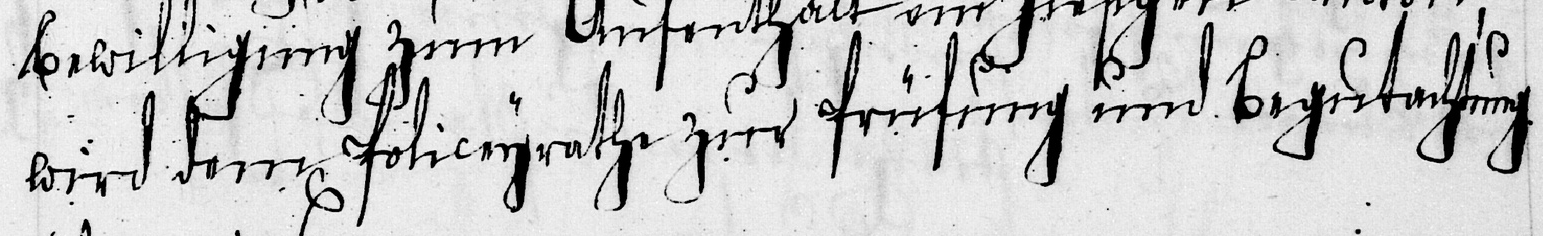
wird dem Policeyrathe zur Prüfung und Begutachtung
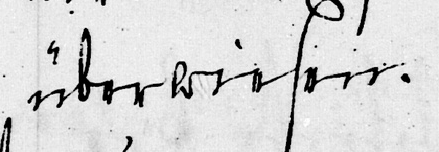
überwiesen.
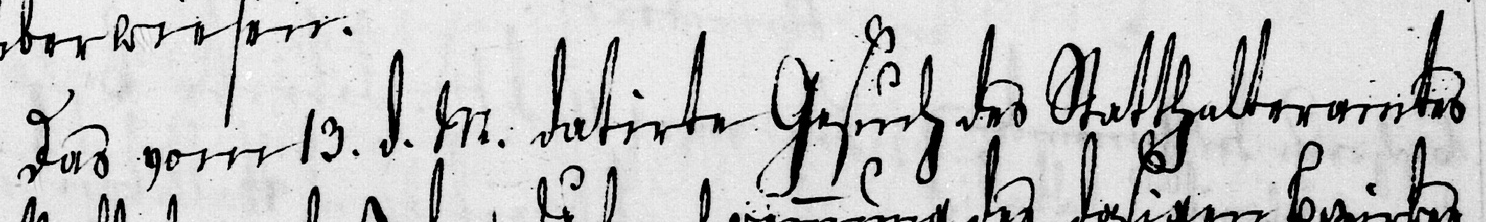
Das vom 13. d. M. datirte Gesuch des Statthalteramtes
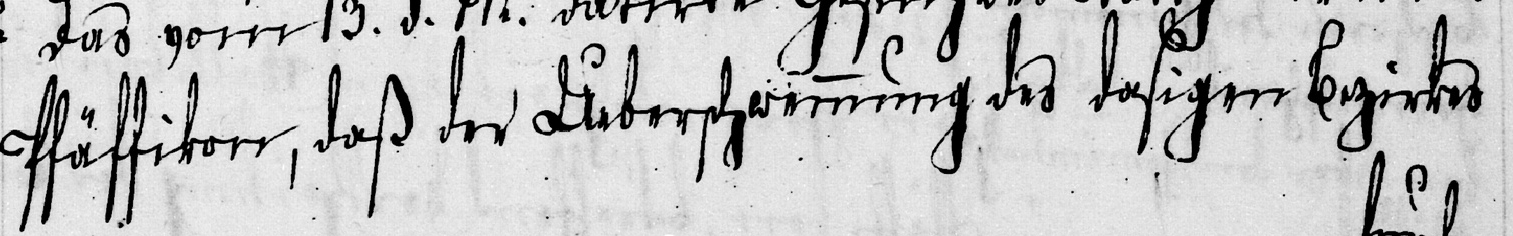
Pfäffikon, daß der Ueberschwemmung des dasigen Bezirkes
